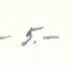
5
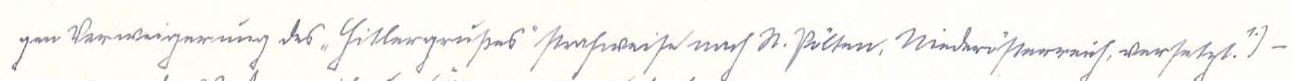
gen Verweigerung des „Hitlergrußes“ strafweise nach St. Pölten, Niederösterreich versetzt. 1)-
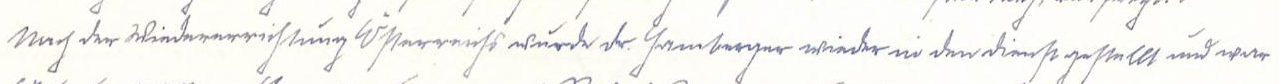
Nach der Wiedererrichtung Österreichs wurde Dr. Hamberger wieder in den Dienst gestellt und war
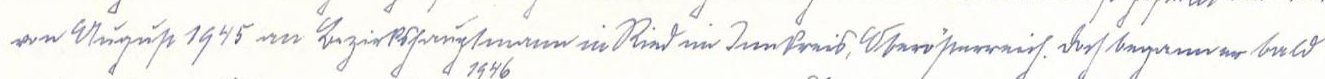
von August 1945 an Bezirkshauptmann in Ried im Innkreis, Oberösterreich. Dort begann er bald
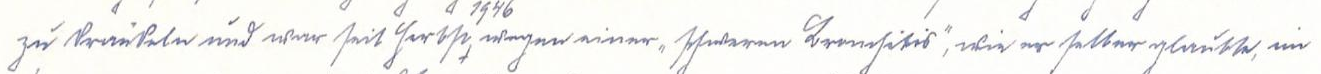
zu kränkeln und war seit Herbst 1946 wegen einer „schweren Bronchitis“, wie er selber glaubte, im
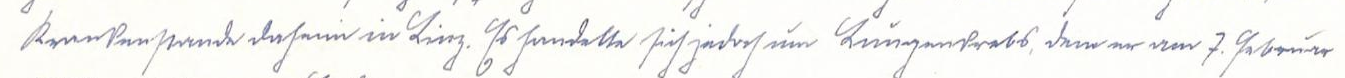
Krankenstande daheim in Linz. Es handelte sich jedoch um Lungenkrebs, dem er am 7. Februar
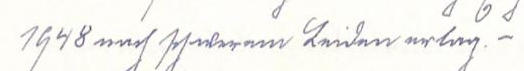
1948 nach schwerem Leiden erlag.
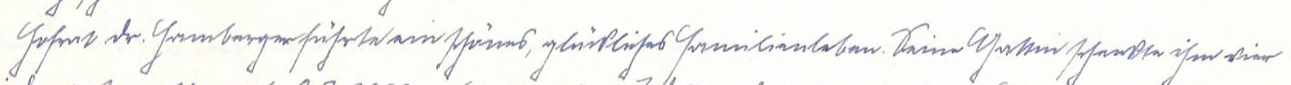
Hofrat Dr. Hamberger führte ein schönes, glückliches Familienleben. Seine Gattin schenkte ihm vier
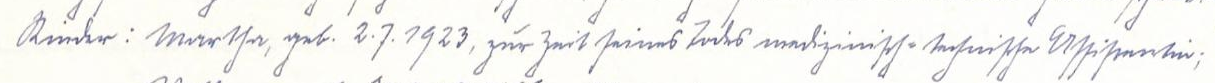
Kinder: Martha, geb. 2.7.1923, zur Zeit seines Todes medizinisch-technische Assistentin;
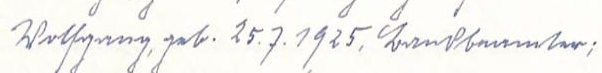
Wolfgang, geb. 25.7.1925 Bankbeamter;
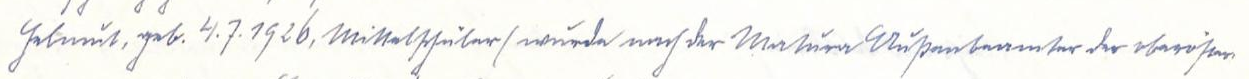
Helmut, geb. 4. 7. 1926, Mittelschüler (wurde nach der Matura Außenbeamter der oberöster-
